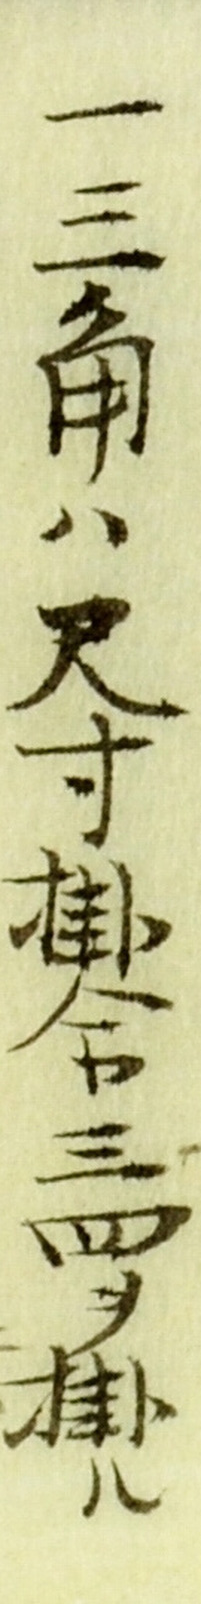一三角ハ尺寸掛合三四ヲ掛ル
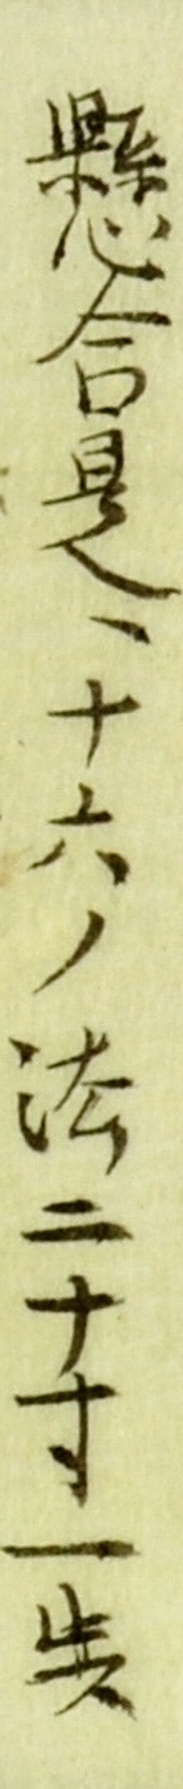懸合是ヘ十六ノ法二十寸一歩
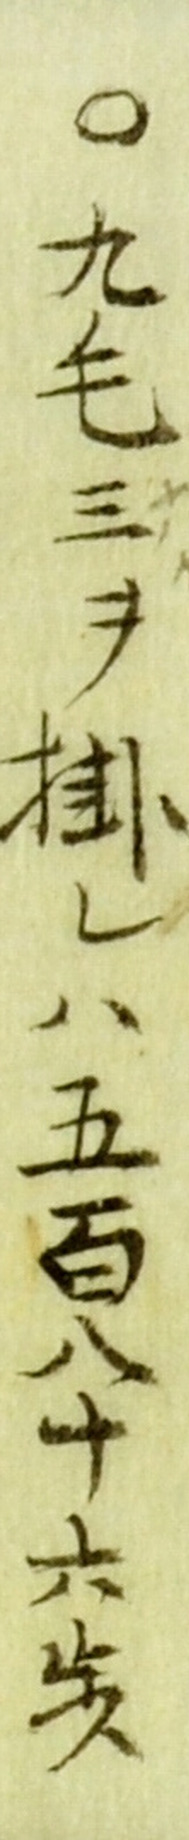〇九毛三ヲ掛レハ五百八十六歩
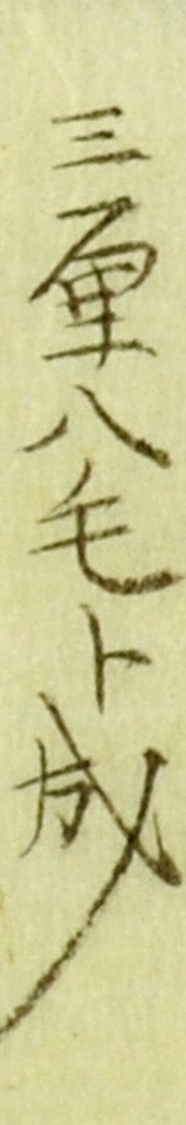三厘八毛ト成

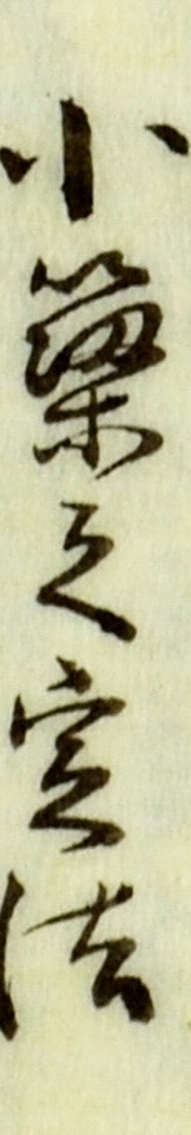小簗之定法
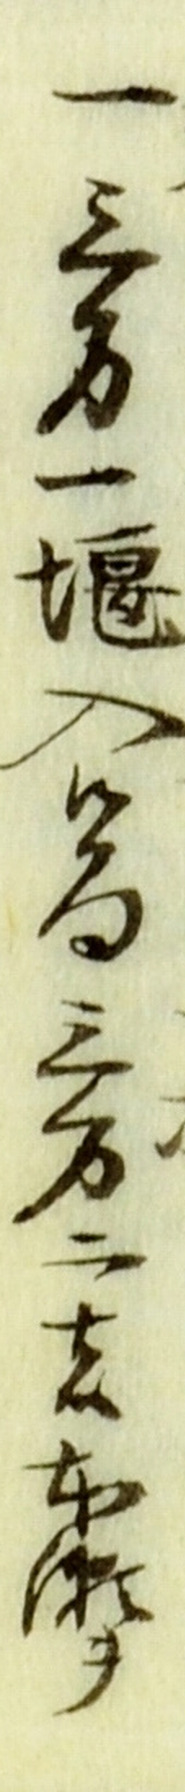一三分一堰入候而三分二者布瀬ヲ
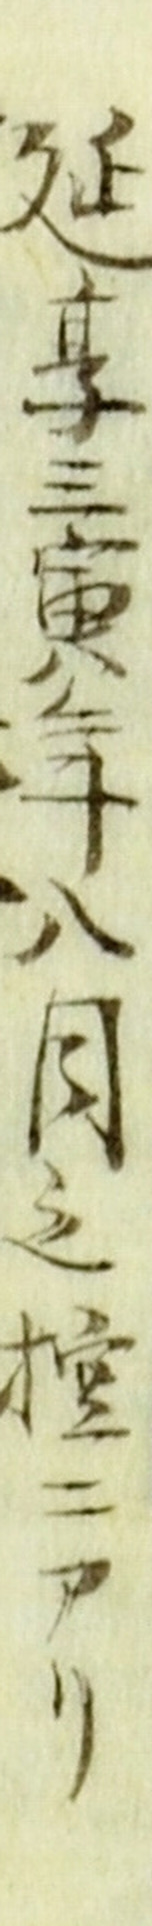延享三寅年八月之控ニアリ
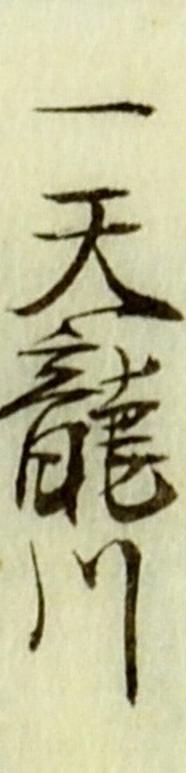一天竜川
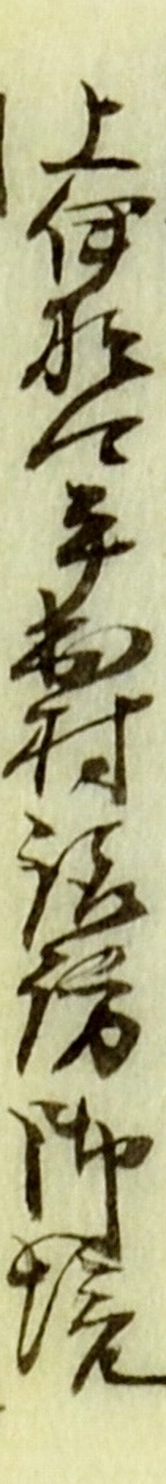上伊那郷平出村諏訪御境
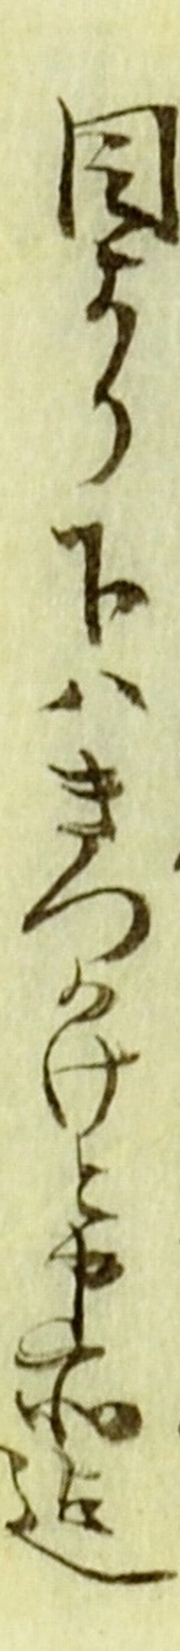目より下ハきつかけと申所迄
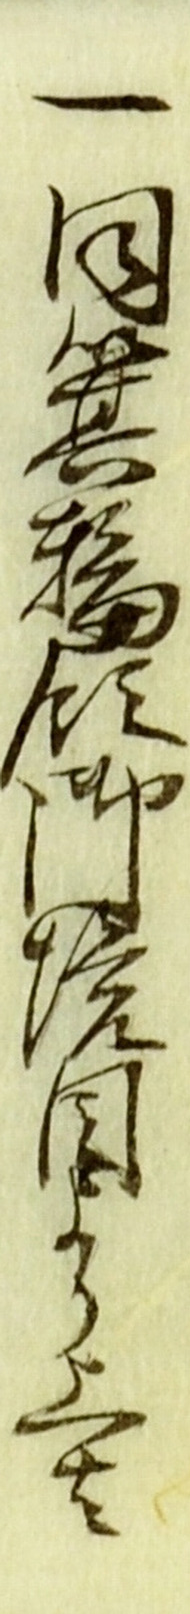一同箕輪領御境目より上者
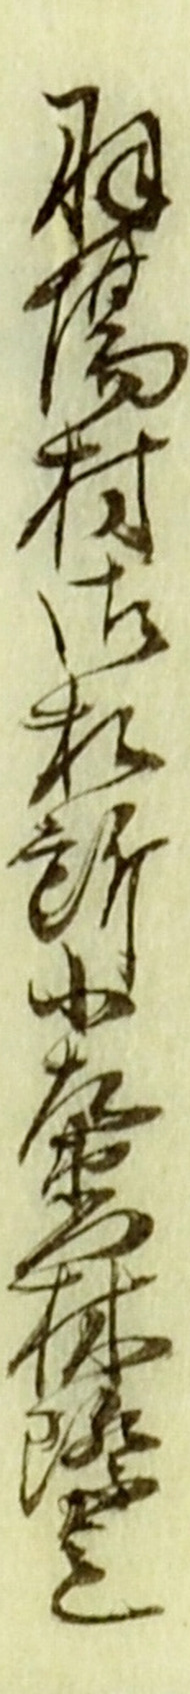羽場村御札所小左衛門林際迄
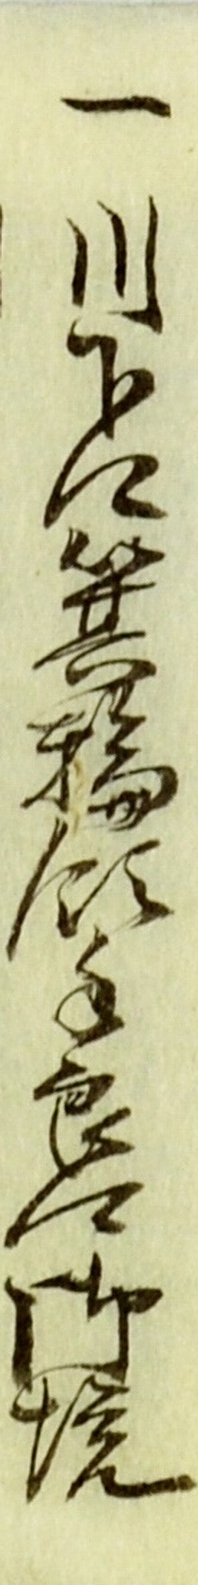一川下郷箕輪領手良郷御境
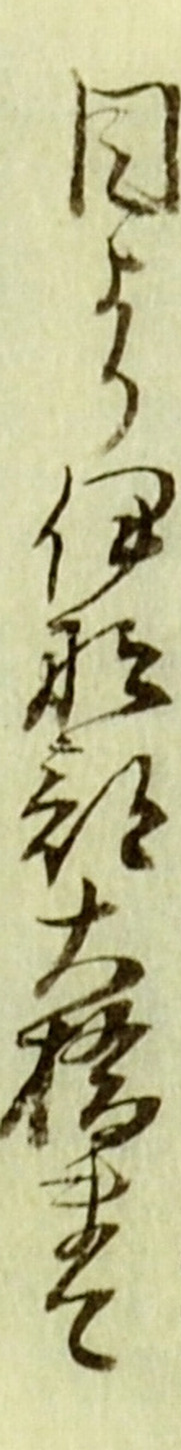目より伊那郡大橋まて
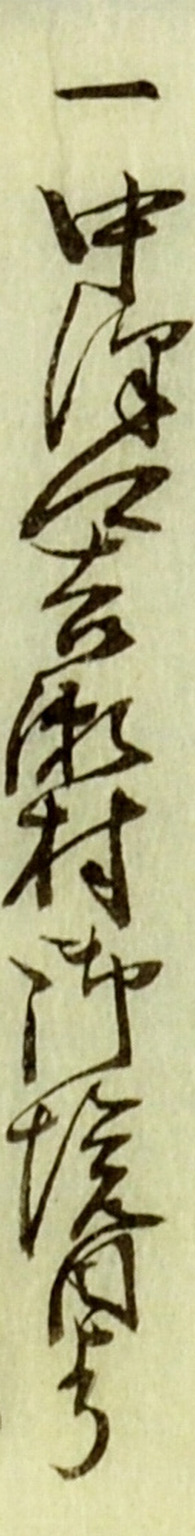一中津郷吉瀬村御境目より
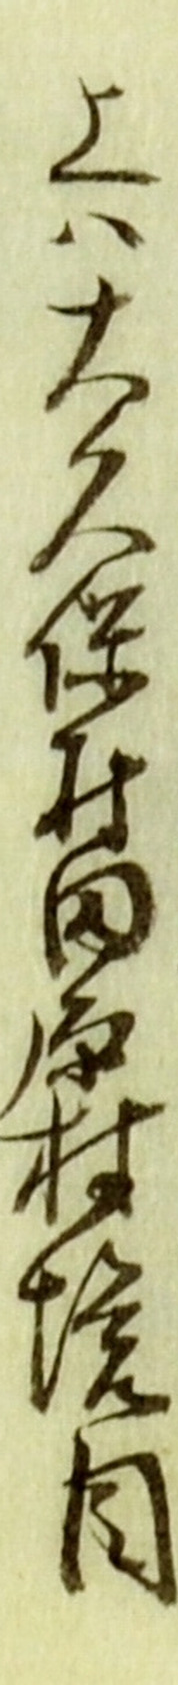上ハ大久保村田原村境目
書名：分一御定法
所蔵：伊那市立高遠町図書館・合同会社AMANE
